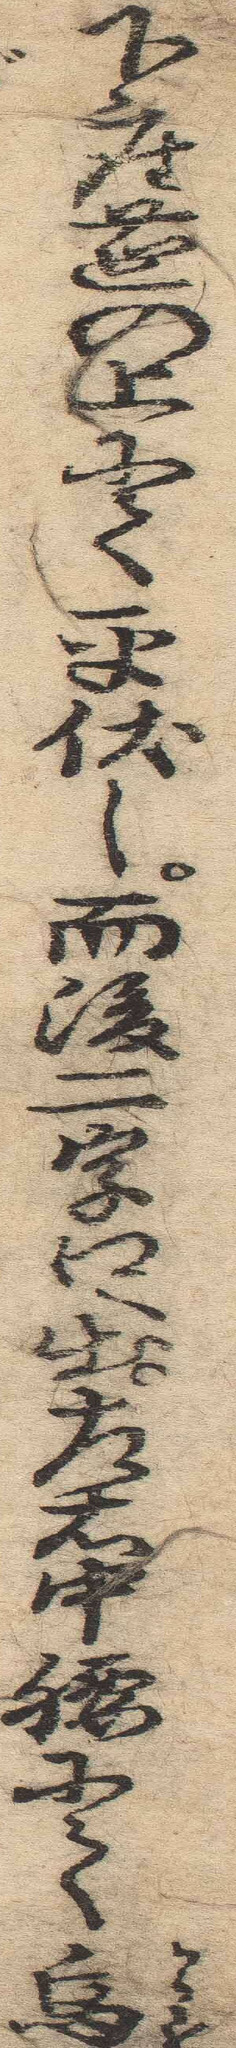下座筵の上にて平伏し。而後二字口へ出。左右中腰にて烏
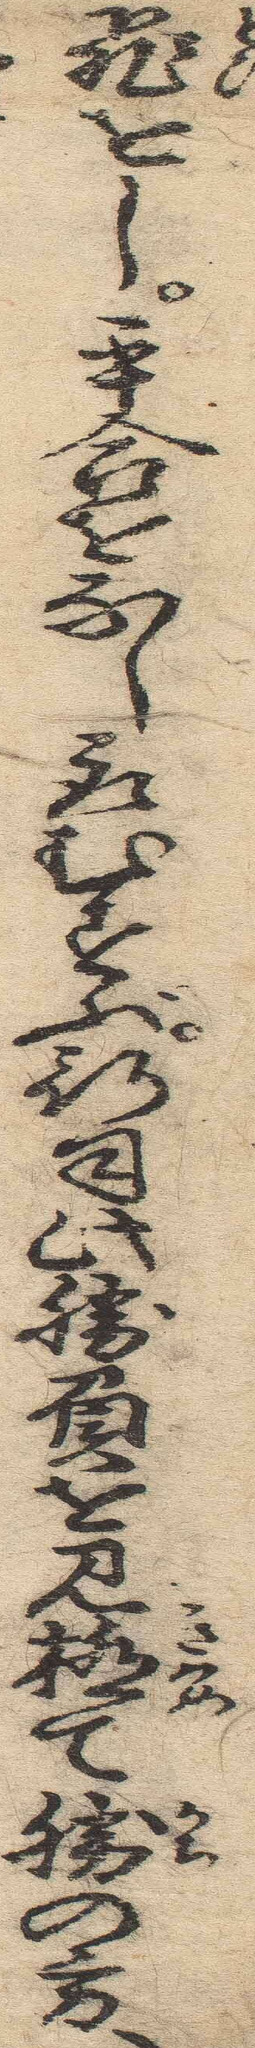飛をし。手合をなし取むすぶ。行司此勝負を見極て勝の方へ
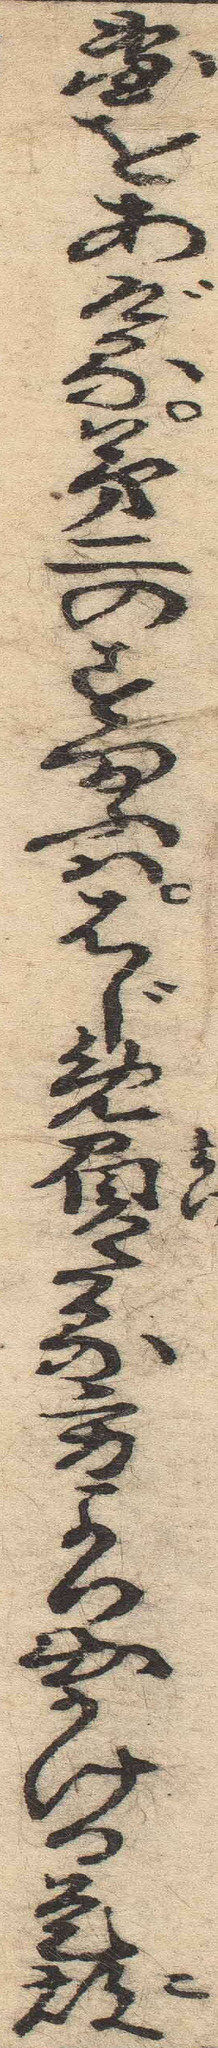団をあげる。第二のすまふは。はじめ負たる方より出かける是故
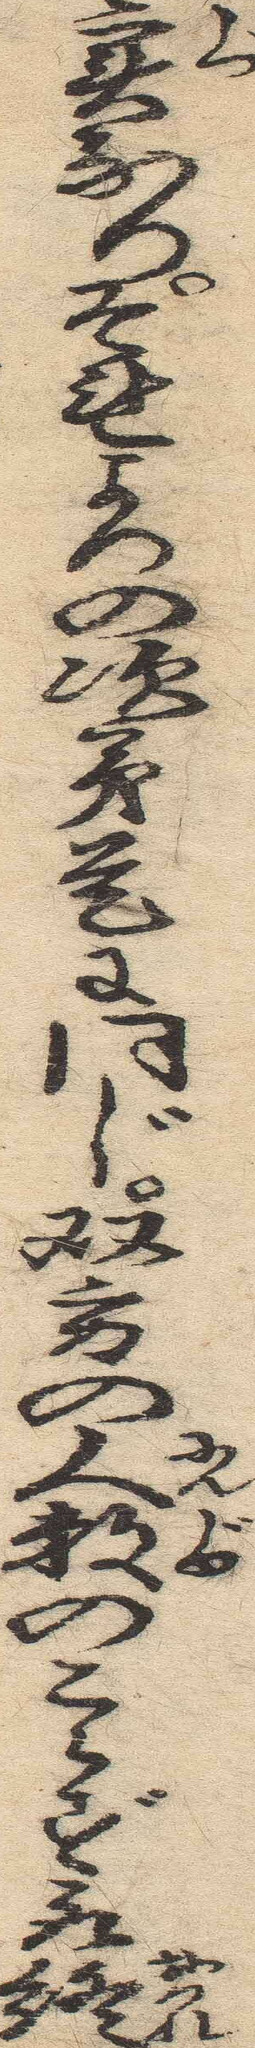実なり。それよりの次第是に同じ。双方の人数のこらず取終
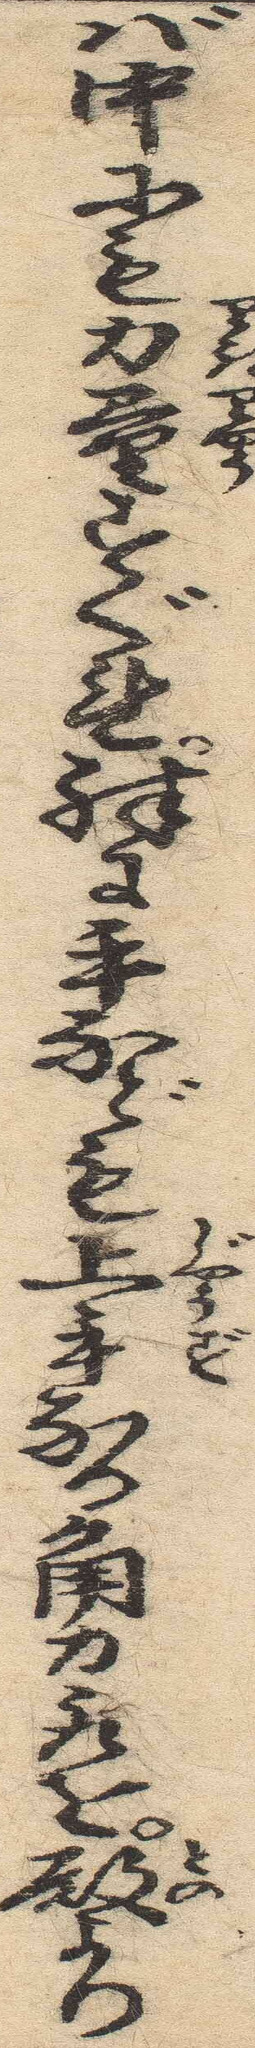ば中にも力量すぐれ。殊に手なども上手なる角力取を。殿より
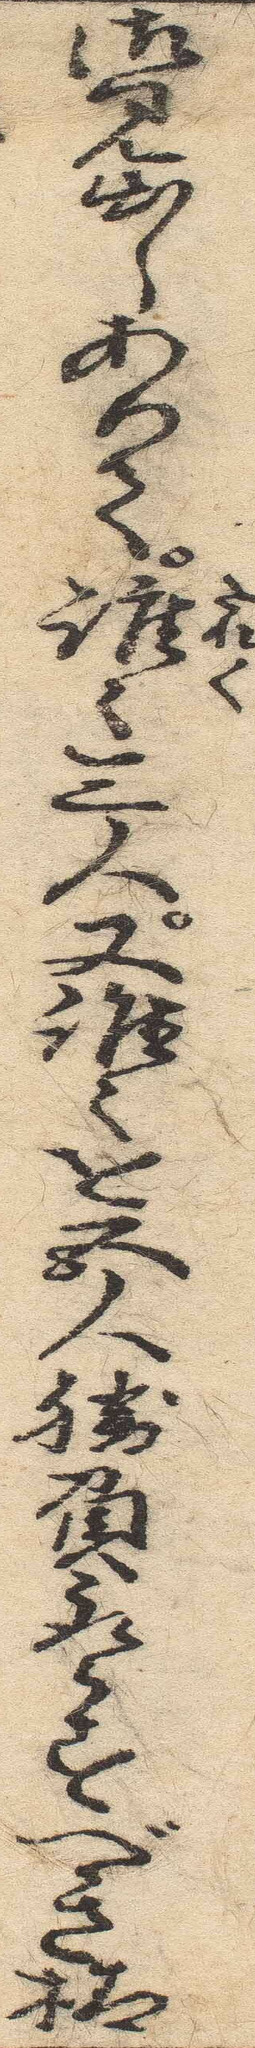御見出しありて。誰々三人。又誰々を五人勝負取らすべき様
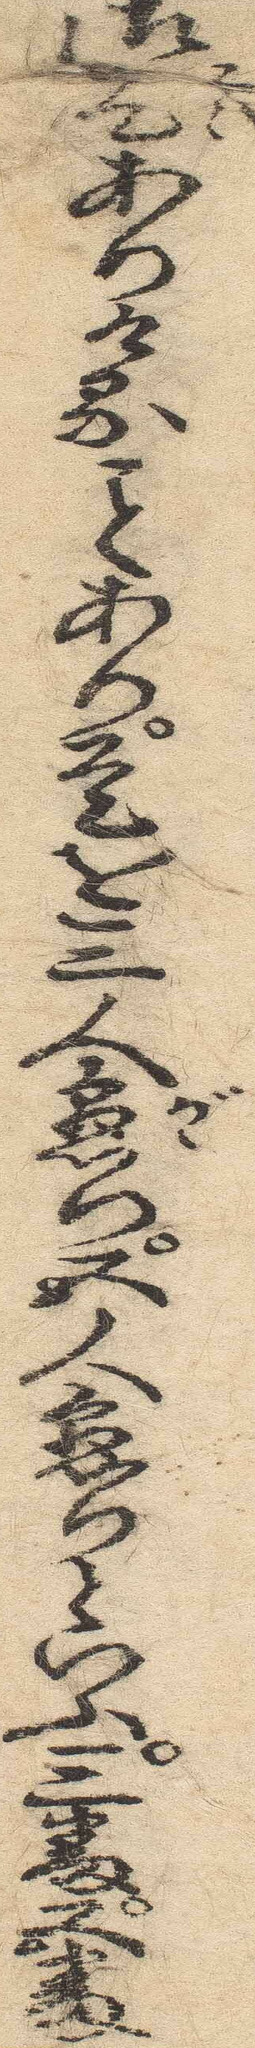御乞ありけることあり。是を三人懸り。五人懸りといふ。三番。五番
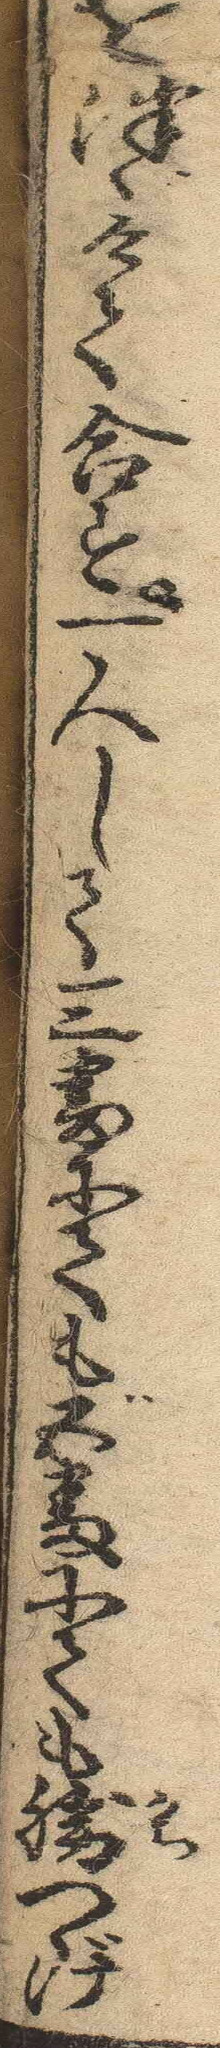をつゞけて合す。一人して三番にても五番にても勝つゞけ
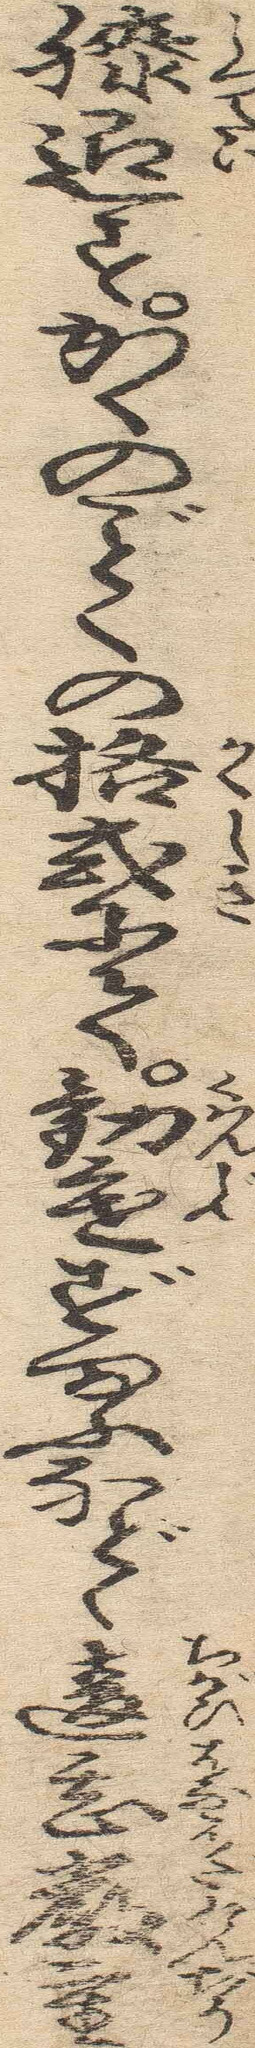膝退す。かくのごとくの格式にて。勧進ずまふなど〳〵違甚厳重
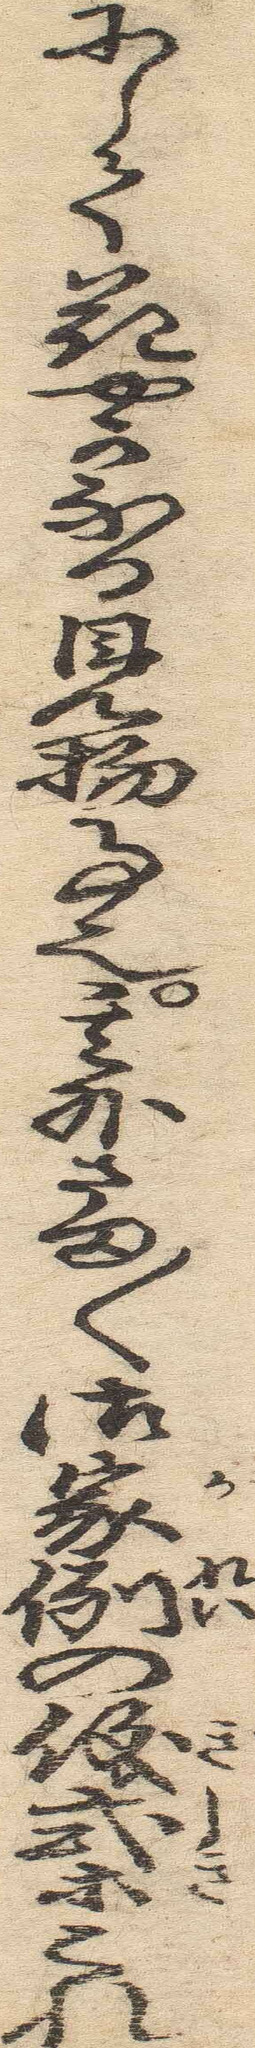にして花やかなる見物事也。其外さま〳〵御家例の儀式等これ
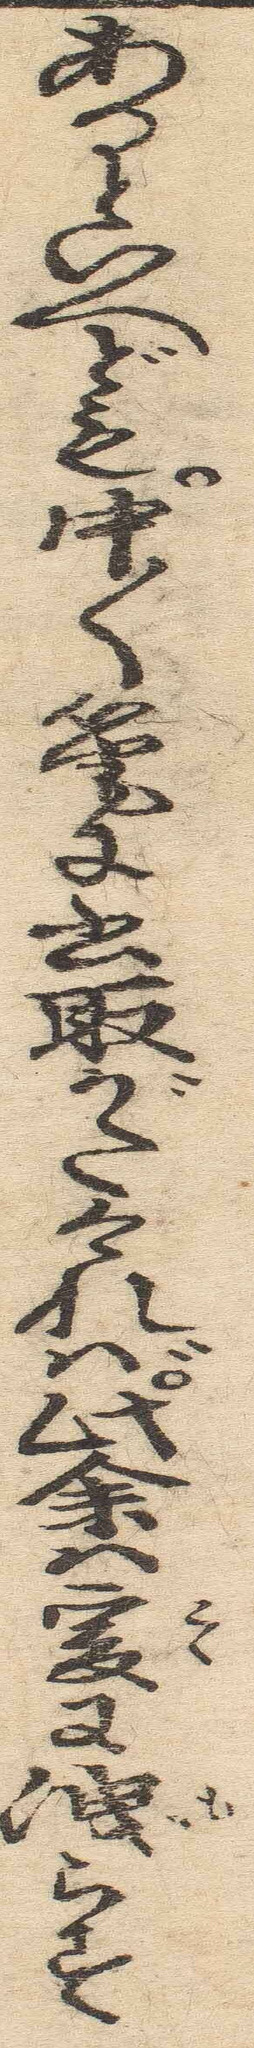あるといへども。中〳〵筆に書取がたければ。此余は爰に洩らす
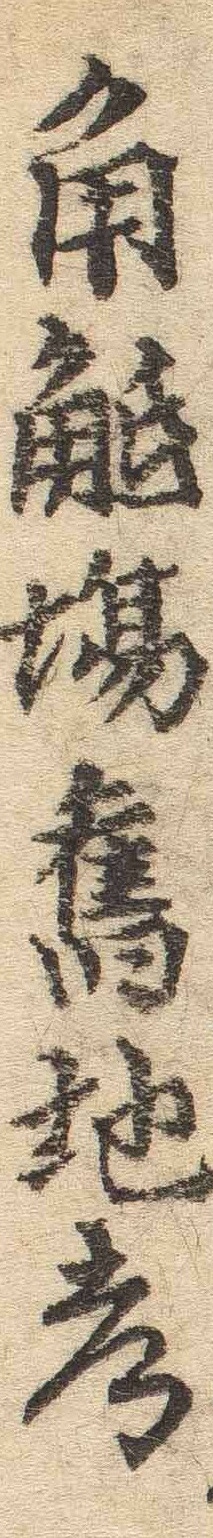角觗場舊地考
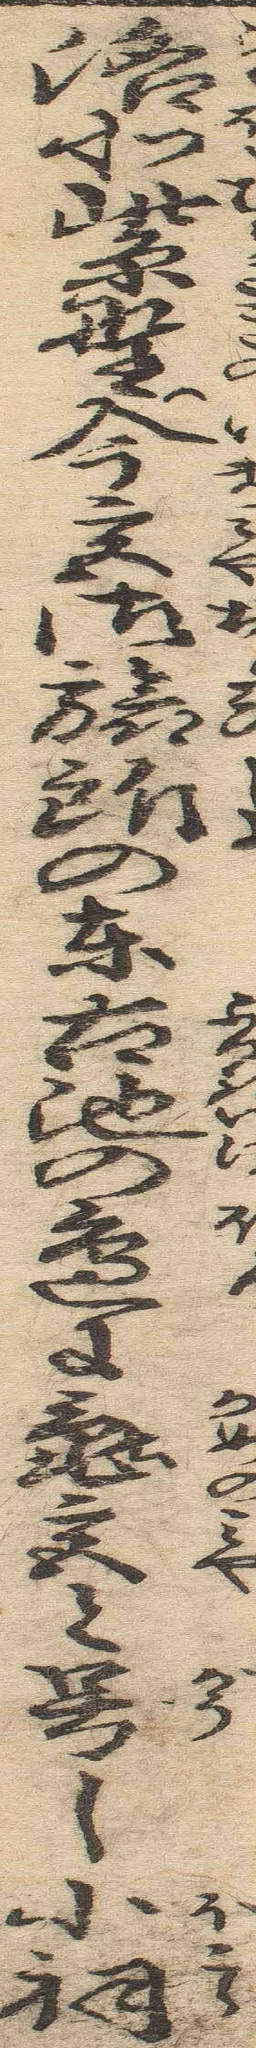洛北紫野。今宮御旅所の東古池の辺に亀宮と号し小祠
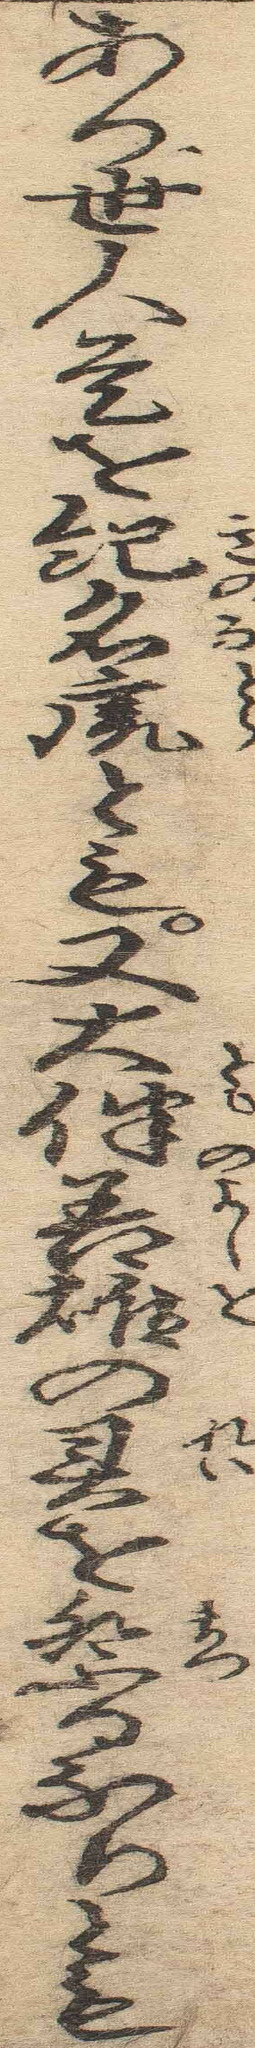あり世人是を紀名虎とも。又大伴善雄の霊を祭るなりとも
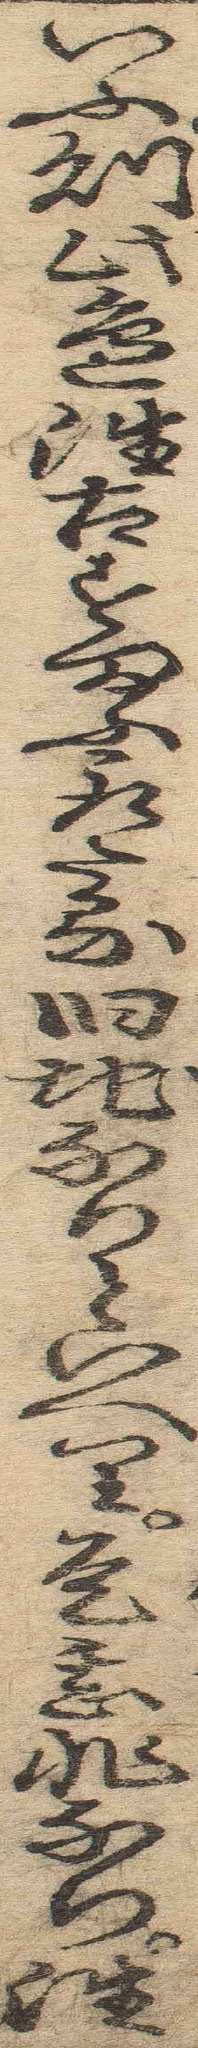いふ。則此辺往古すまふ取たる旧地なりといへり。是甚非なり。往
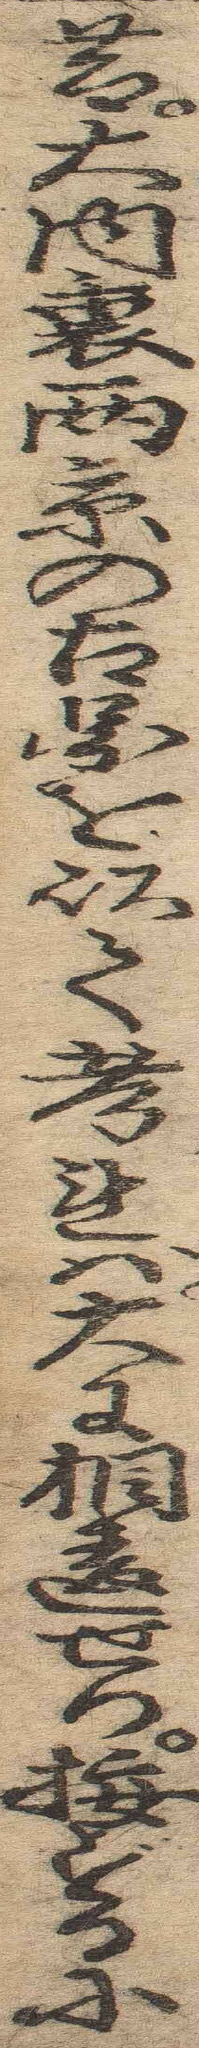古。大内裏両京の古図を以て考れば。大に相違せり。按ずるに
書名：古今相撲大全
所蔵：東京学芸大学附属図書館 国文学研究資料館
